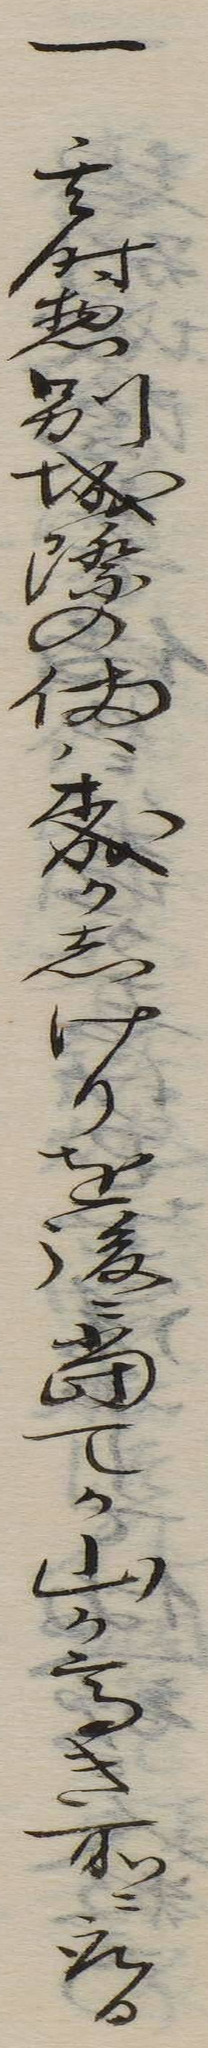一其時惣別城際の備は森かしけりを後ニ当てか山か高き所ニ取る
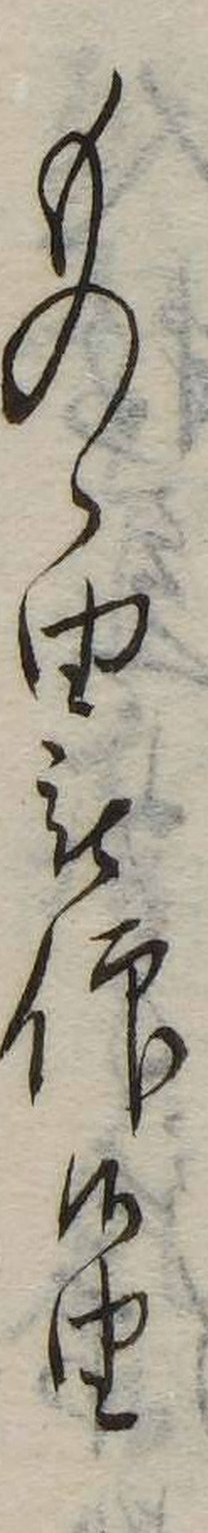ものゝ由被仰候由
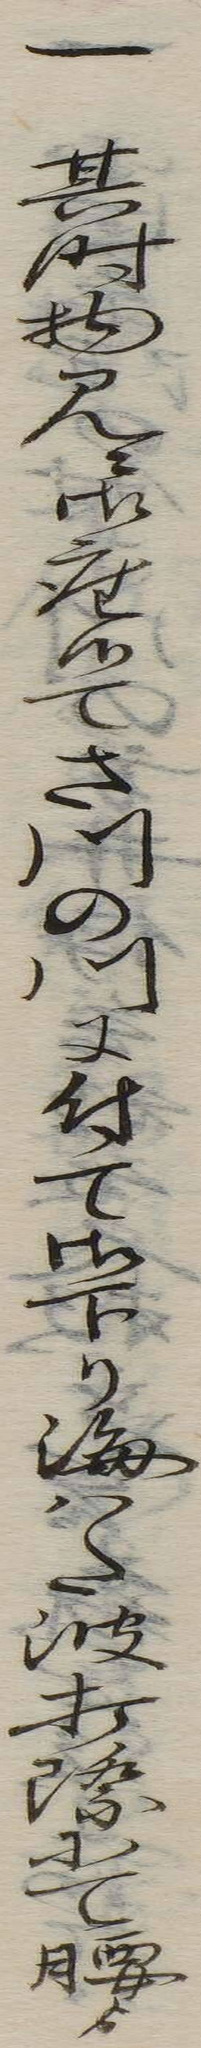一其時物見ニ御座候てさ川の川に付て御下り海はた波打際にて腰ゟ
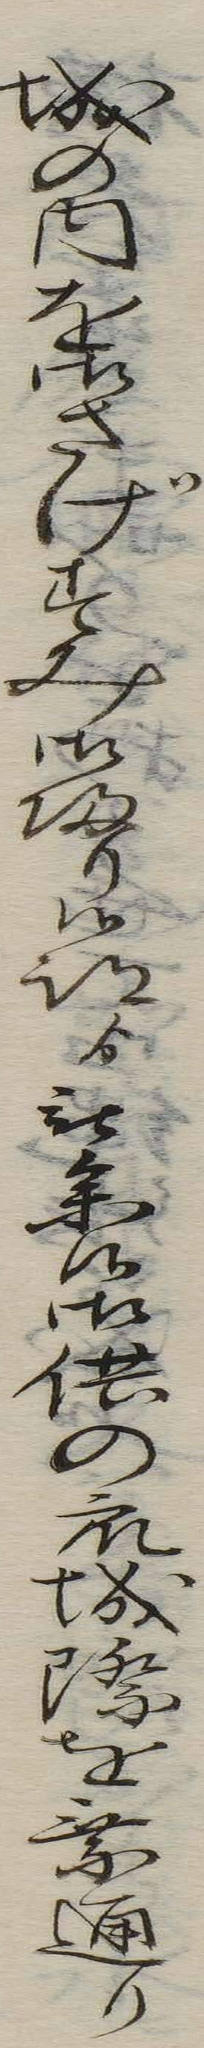城の内を御さげすみ御帰り候跡ゟ被参候御供の衆城際を乗通り
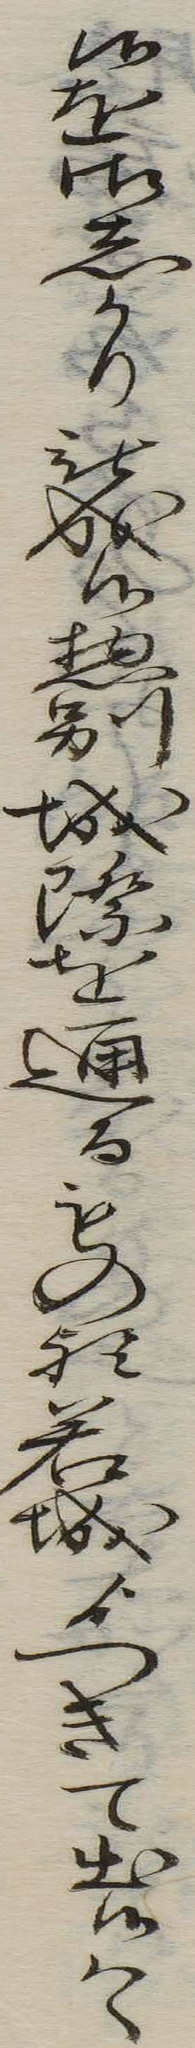候を御しかり被成候惣別城際を通るもの程若城ゟつきて出候はゝ
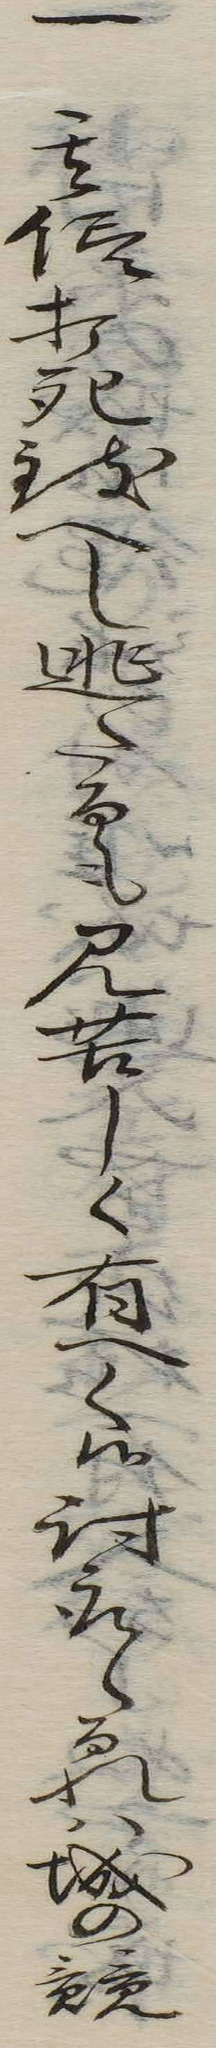一其侭討死致へし逃たる見苦しく有へく候討取らるれは城の競
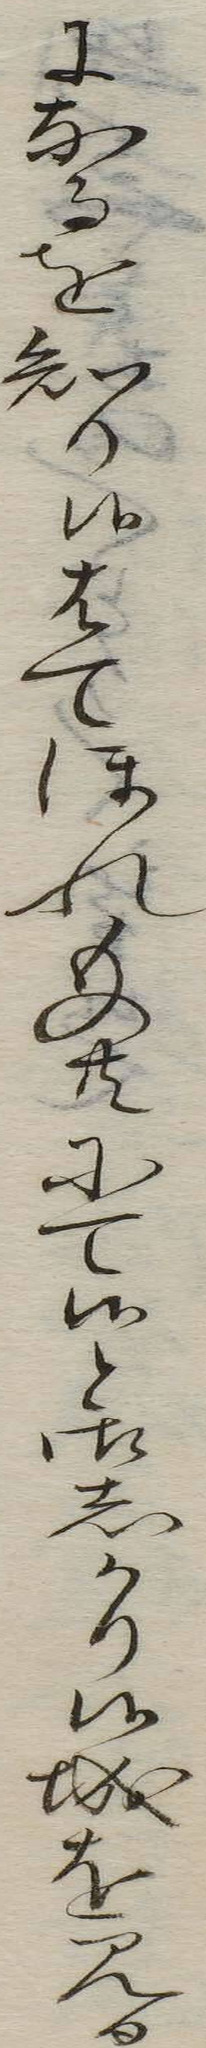になるを知り候はてほれもの共にて候と御しかり候城を見る
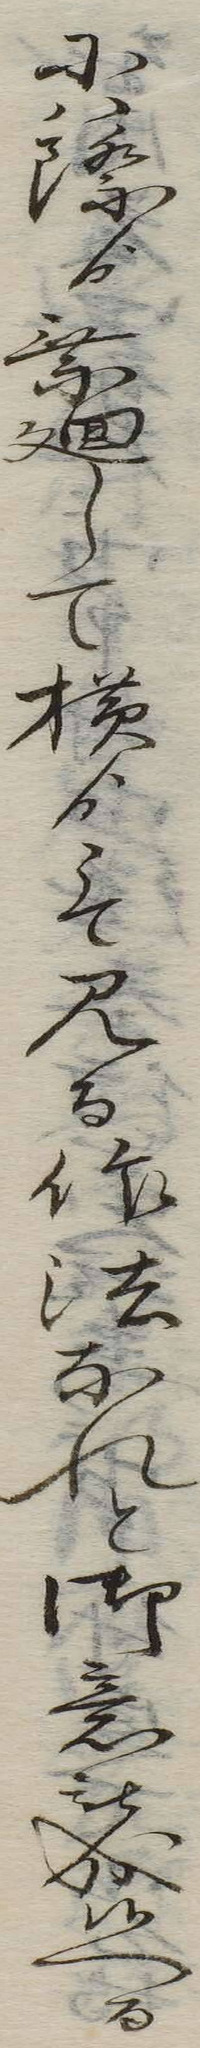には際ゟ乗廻して横ゟこそ見る作法なれと御意被成候つる
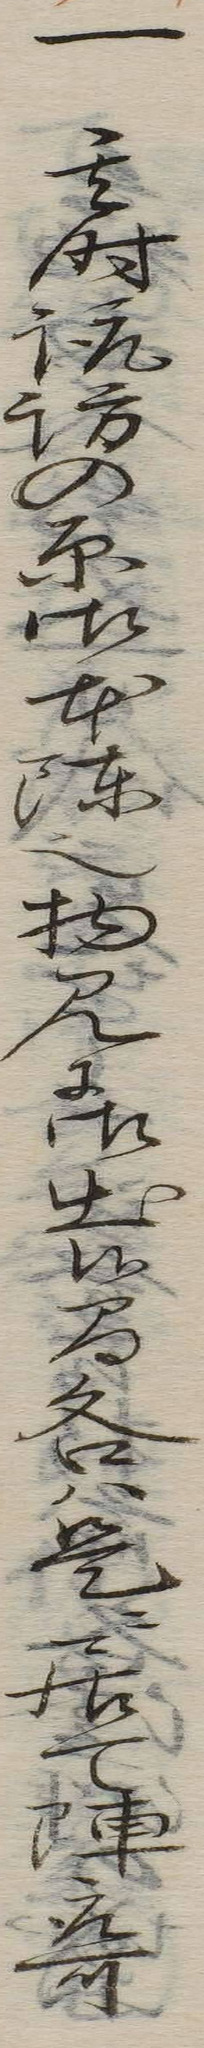一其時諏訪の原御本陣也物見に御出候間各は是ニ居て陣取可
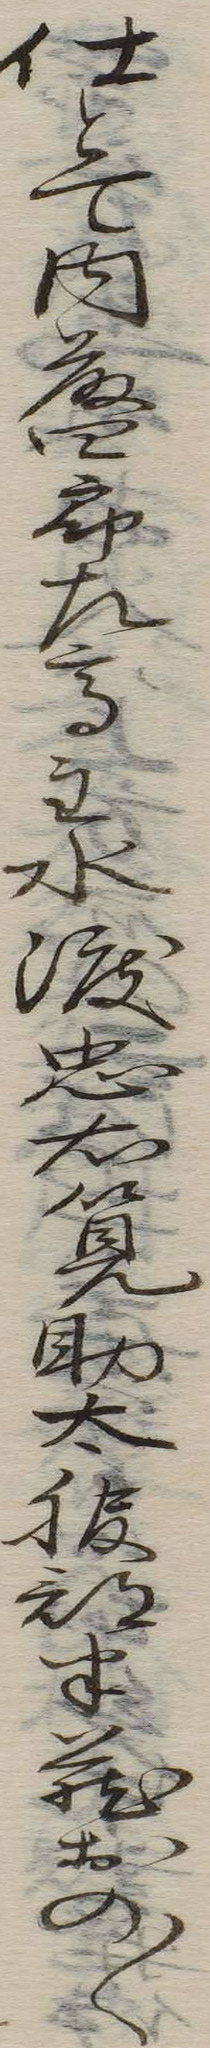仕とて内藤四郎左馬主水渡忠右筧助太服部半蔵おの〳〵
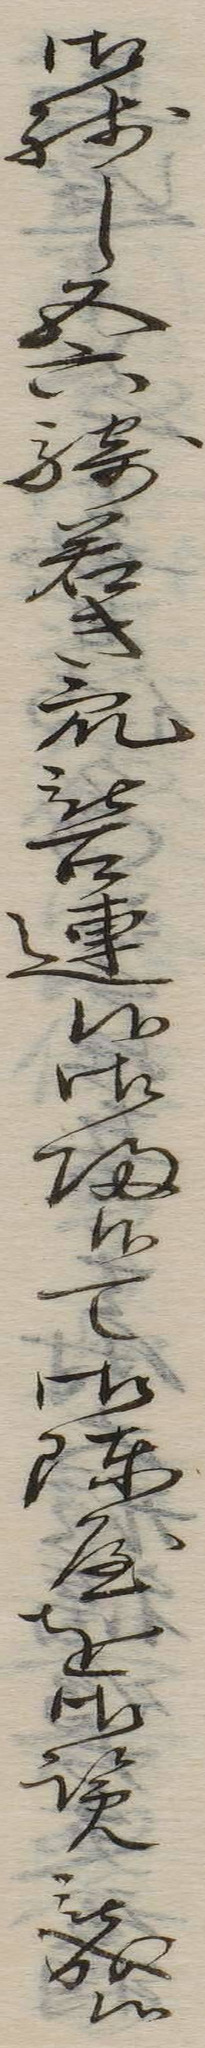御残し五六騎若き衆被召連候御帰候て御陣屋を御覧被成候
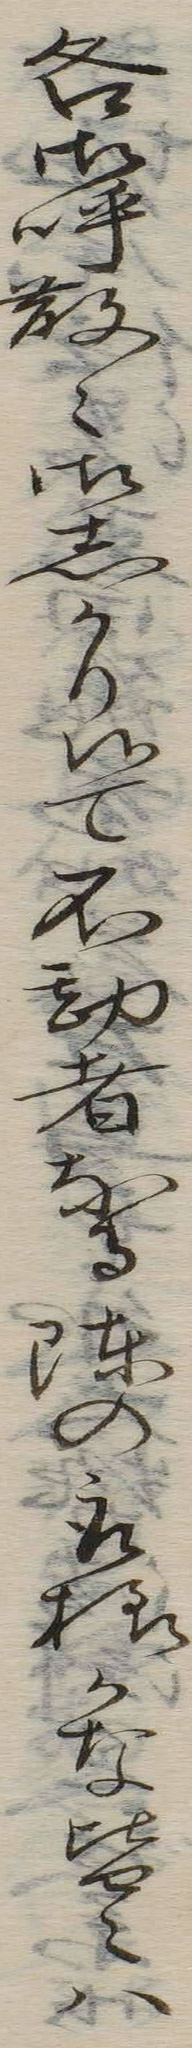各御呼数々御しかり候て不勘者なる陣の取様かな皆々は
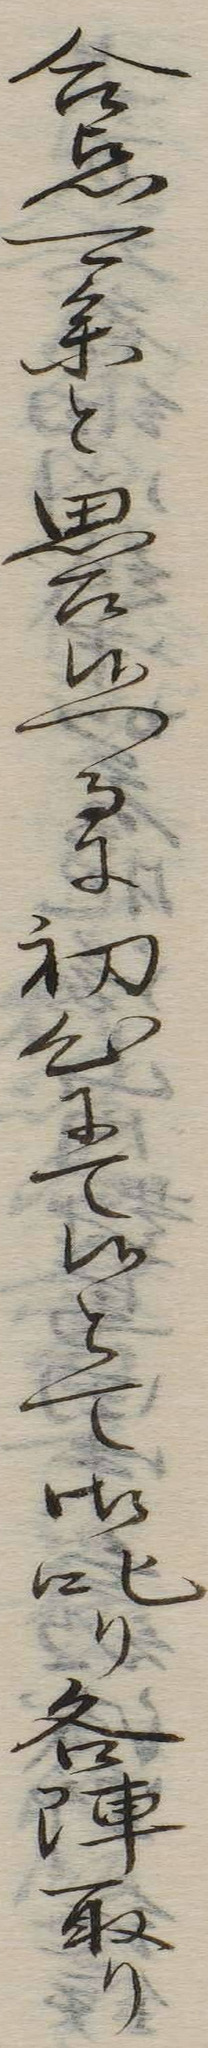合点可参と思召候つるに初心にて候とて御叱り各陣取り
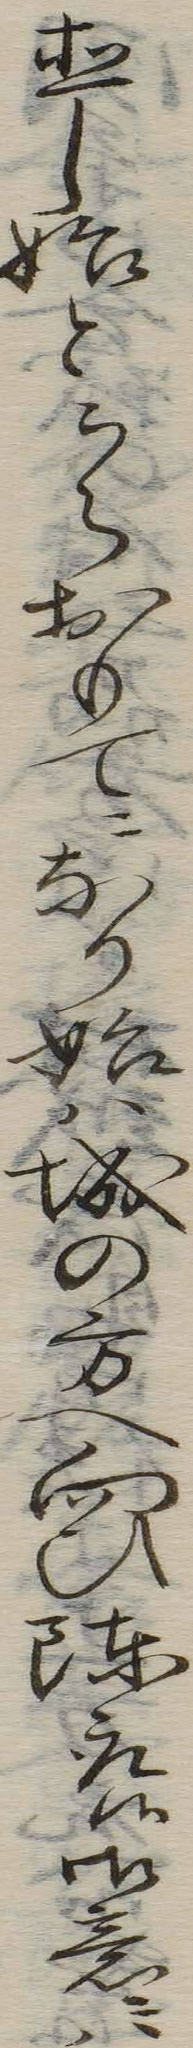直し始とうらおもてニなり始は城の方へ向ひ陣取候御意ニは
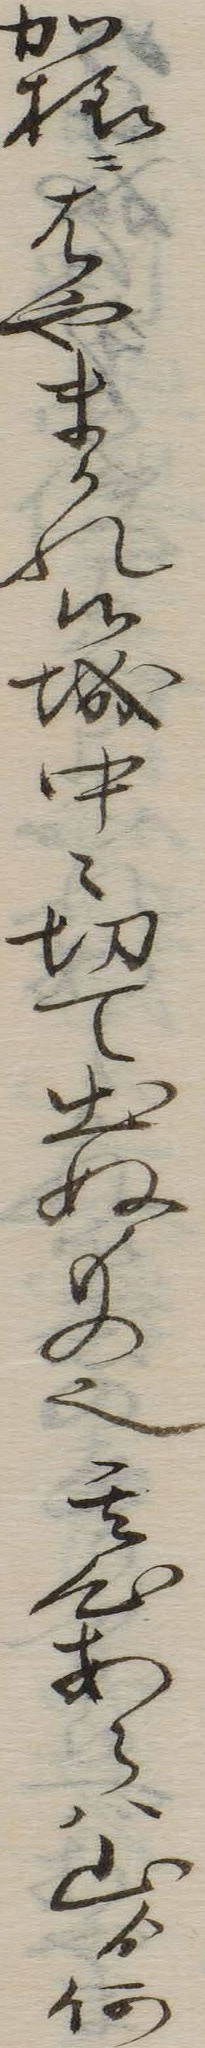か様ニはやまかれ候城中々切て出ぬもの也其心あらは山ゟ何
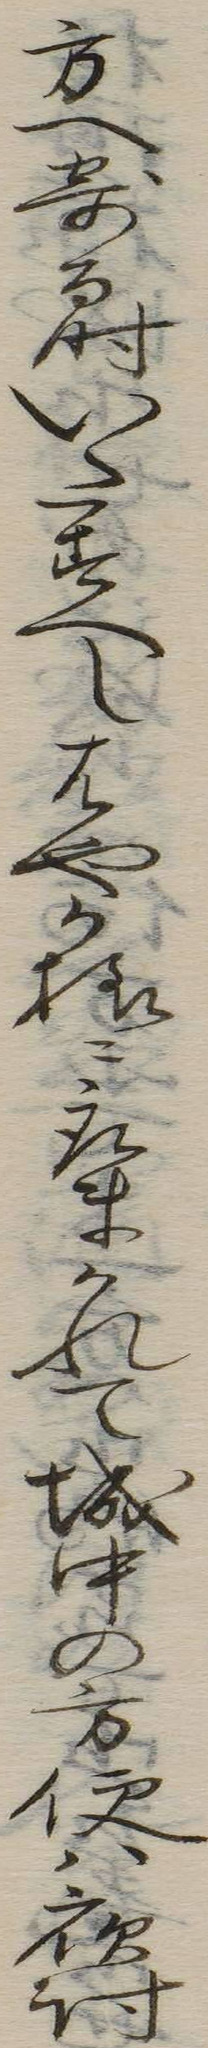方へ寄る時いたすへしはやか様ニ取まかれて城中の方便は夜討
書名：三河之物語
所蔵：国文学研究資料館
